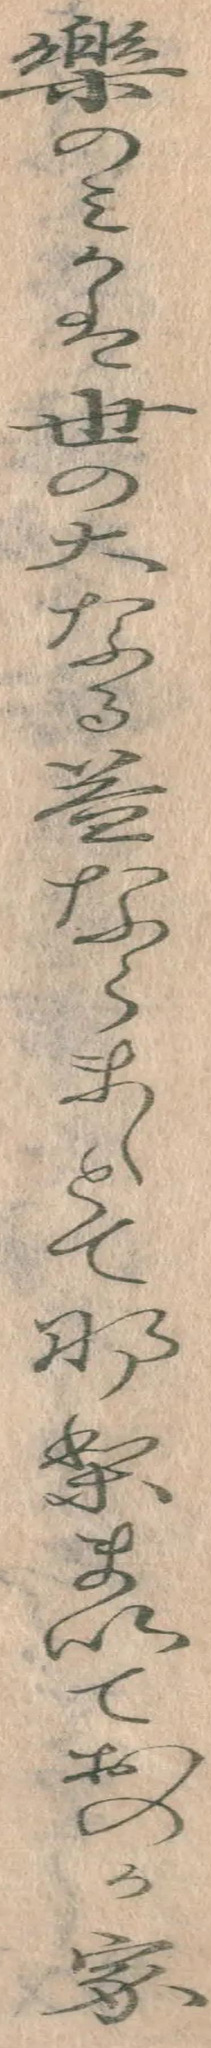楽のみかは世の大なる益ならましとてなりまいておのか家
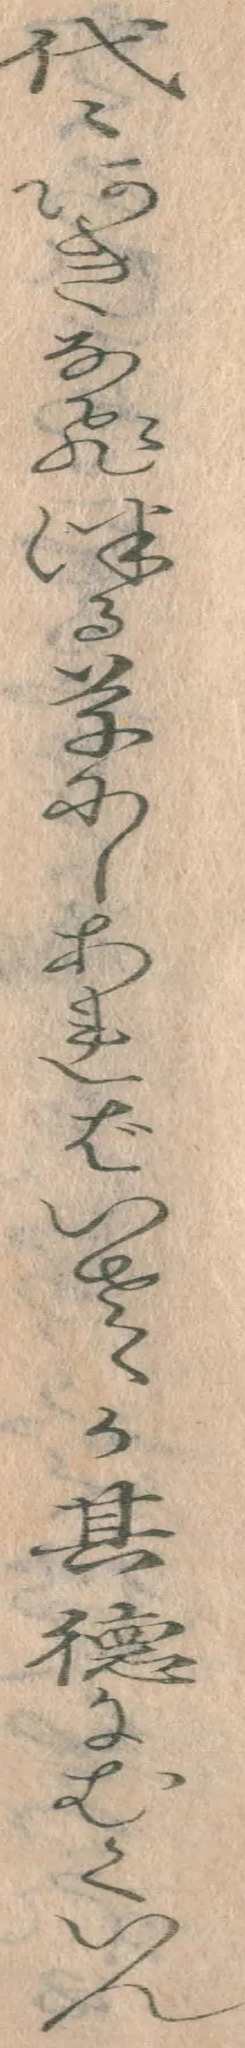代々あきなひつる草にしあればいさゝか其徳にむくいん
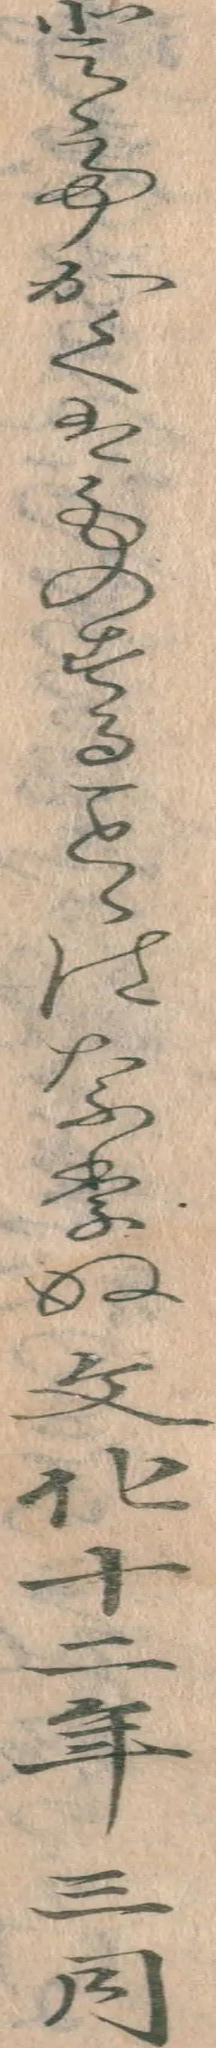とてかくはものすることゝはなりぬ文化十二年三月
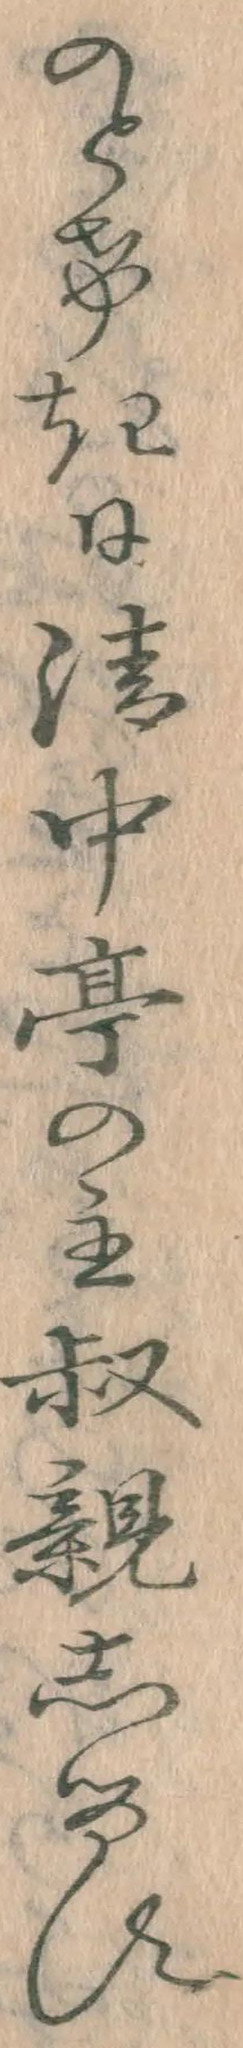のとけき日清中亭の主叔親しるす
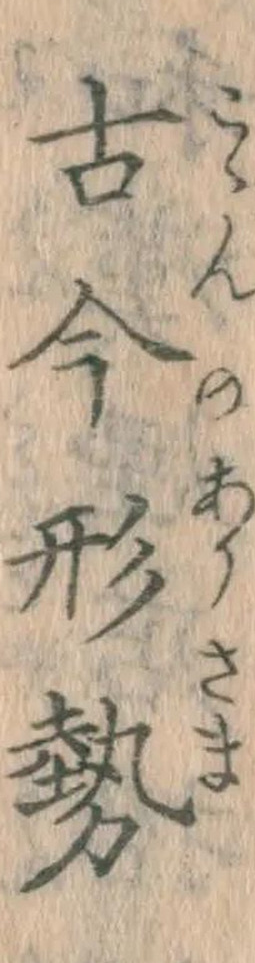古今形勢
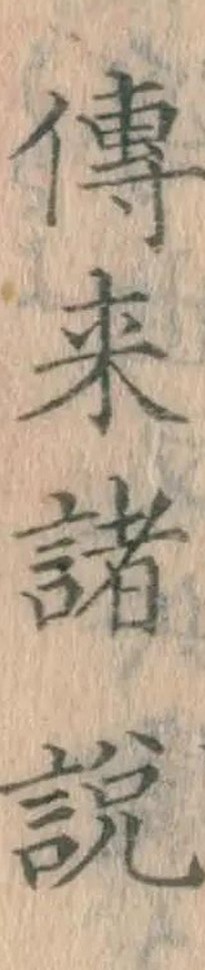伝来諸説
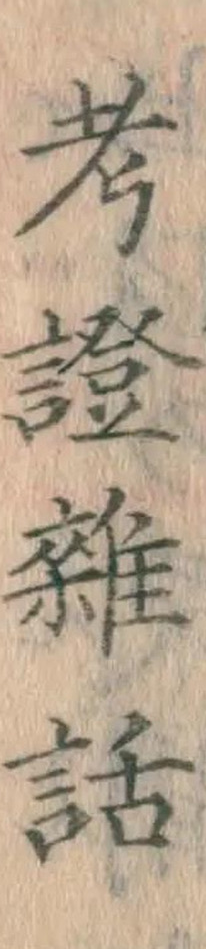考証雑話
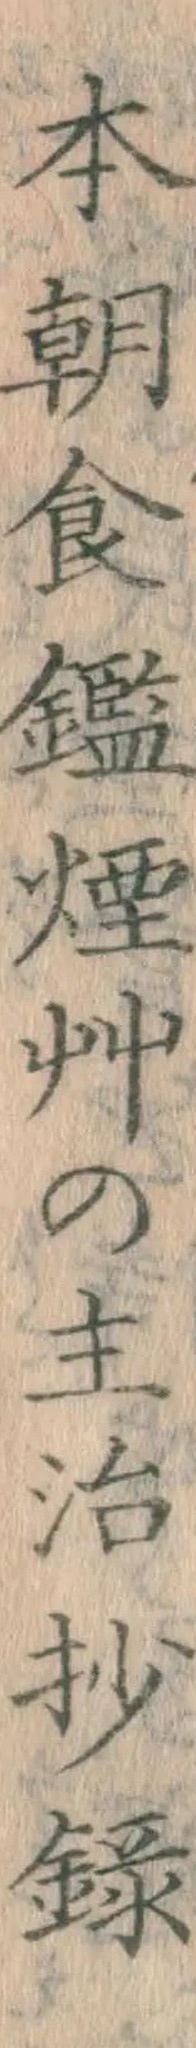本朝食鑑煙艸の主治抄録
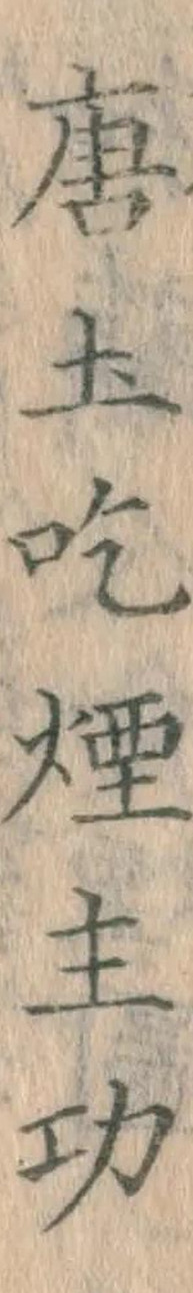唐土吃煙主功
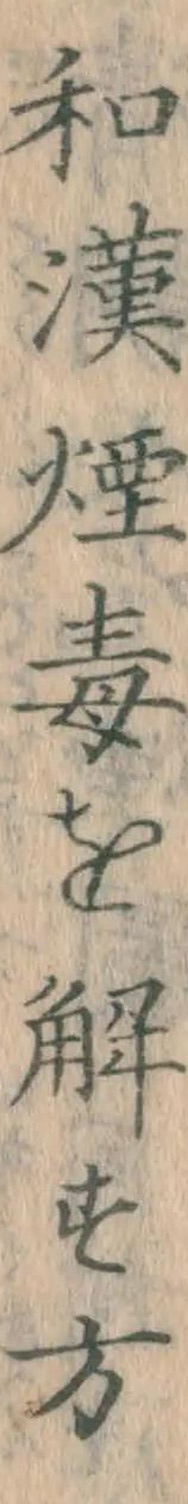和漢煙毒を解す方

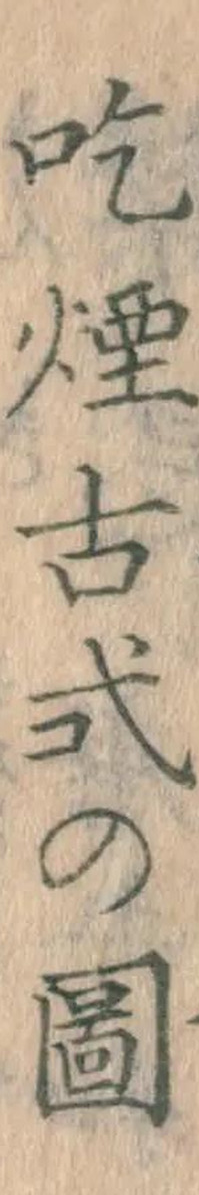吃煙古式の図
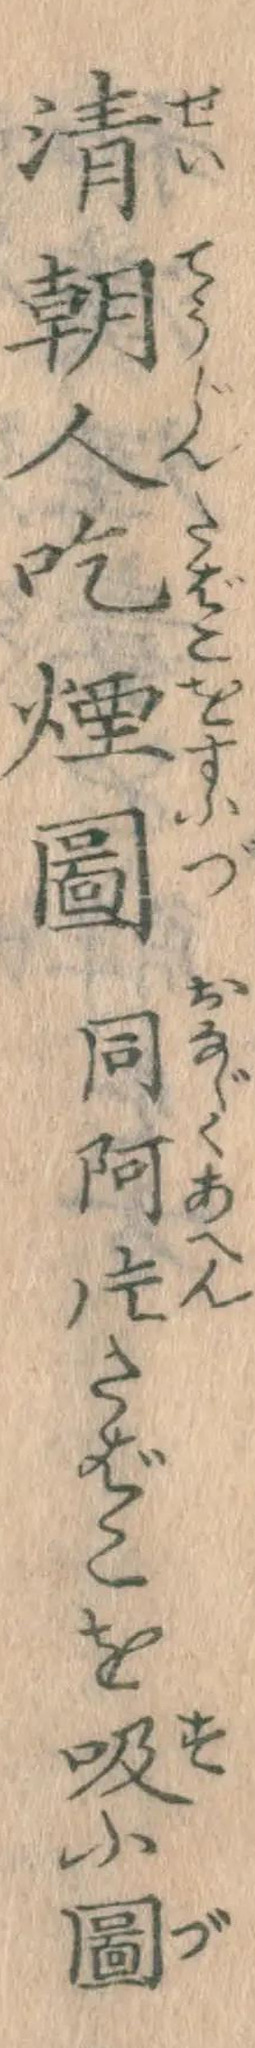清朝人吃煙図同阿片たばこを吸ふ図
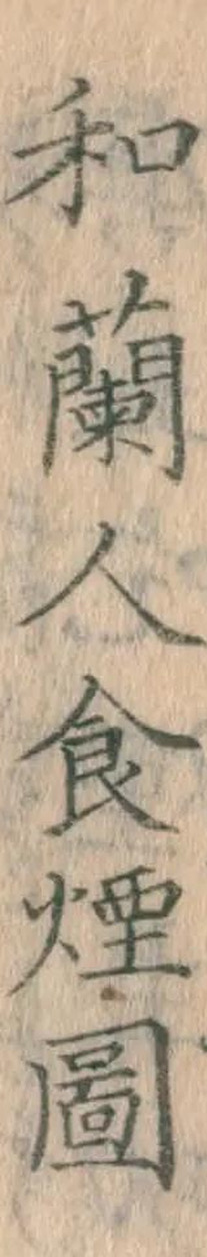和蘭人食煙図
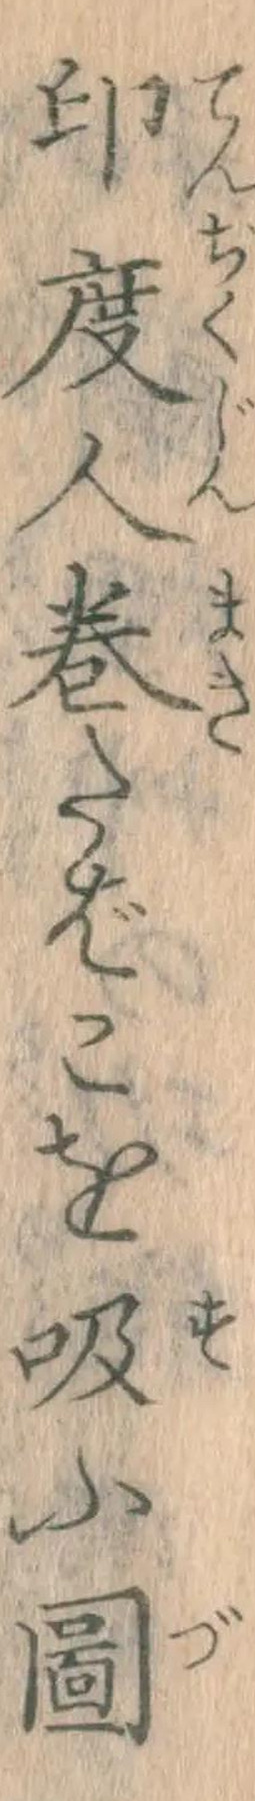印度人巻たばこを吸ふ図
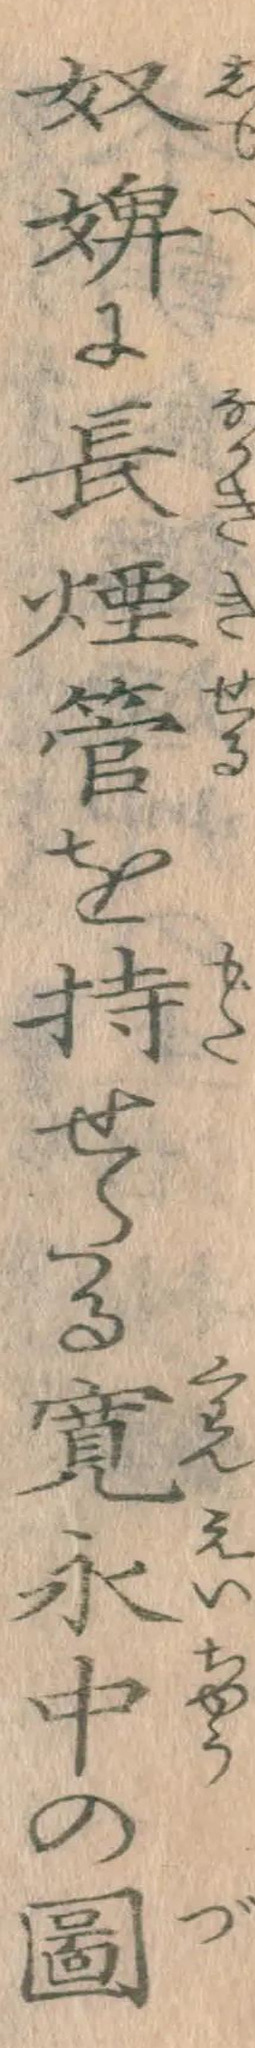奴婢に長煙管を持せたる寛永中の図
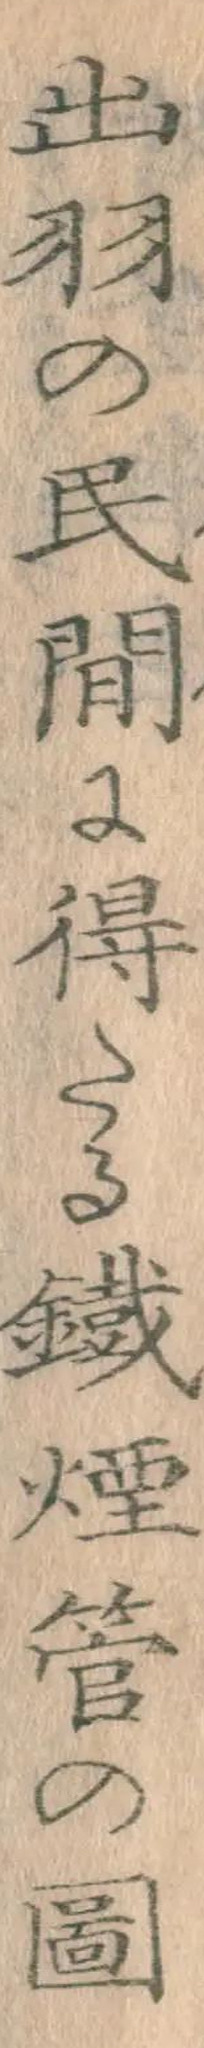出羽の民間に得たる鉄煙管の図
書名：目さまし草
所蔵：国立国会図書館 National Diet Library, JAPAN
